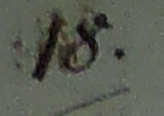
18.
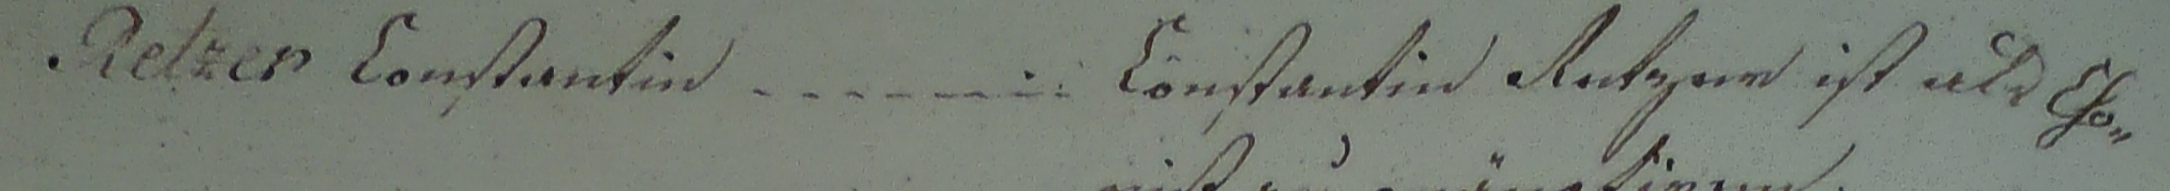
Retzer Constantin ……. Constantin Retzer ist als Cho¬
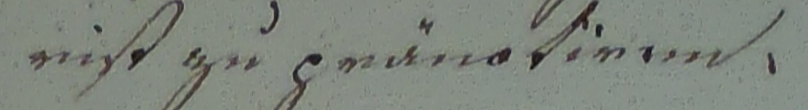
rist zu pränotiren.
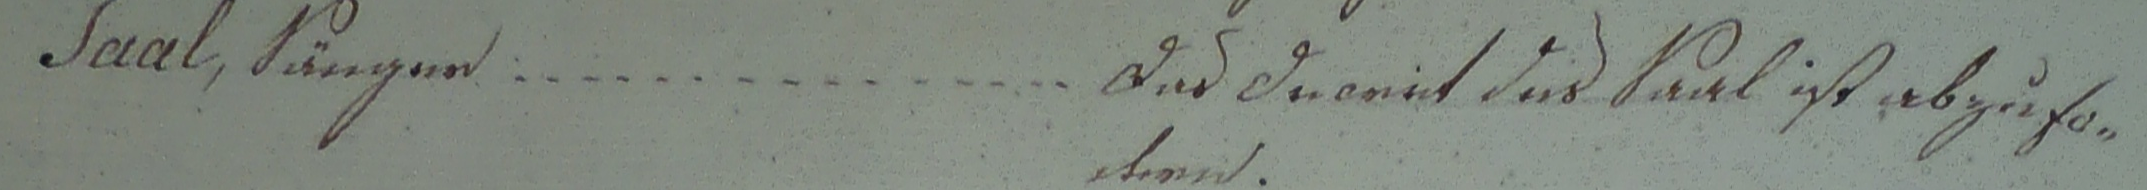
Saal, Sänger …………… Das Decret des Saal ist abzufo¬
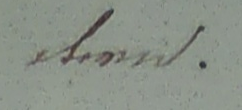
dern.
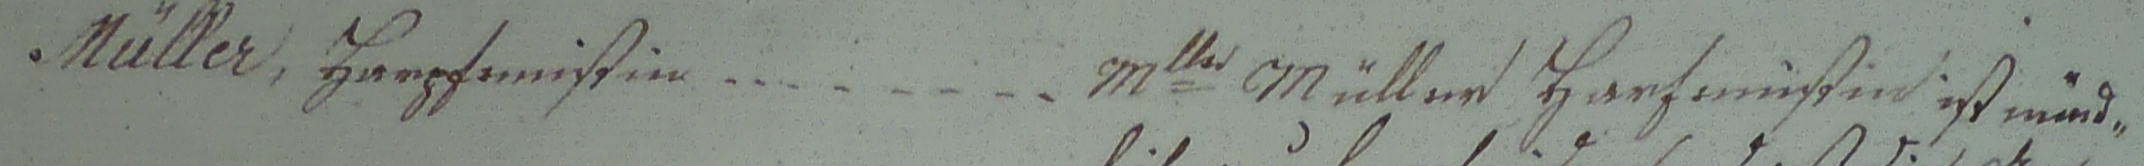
Müller, Harpfenistin …….. Mll͇e Müller Harfenistin ist münd¬
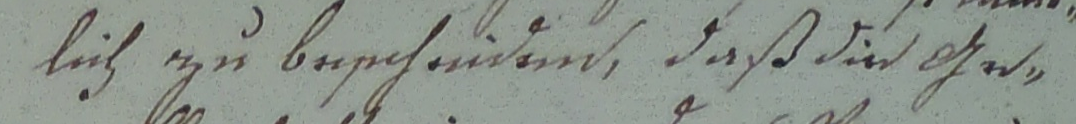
lich zu bescheiden, daß die Ge¬
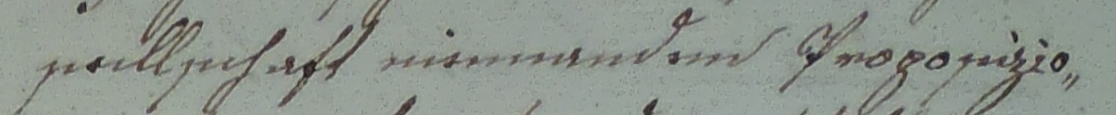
sellschaft niemandem Proposizio¬
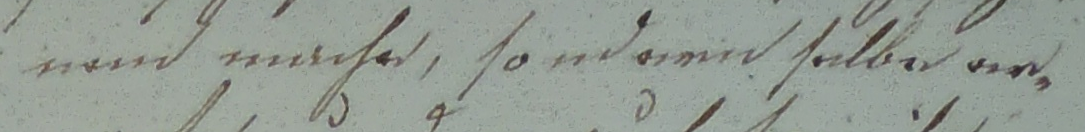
nen mache, sondern selbe er¬
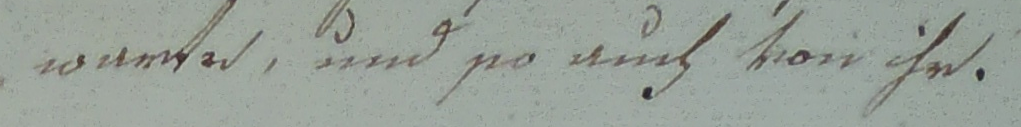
warte, und so auch von ihr.
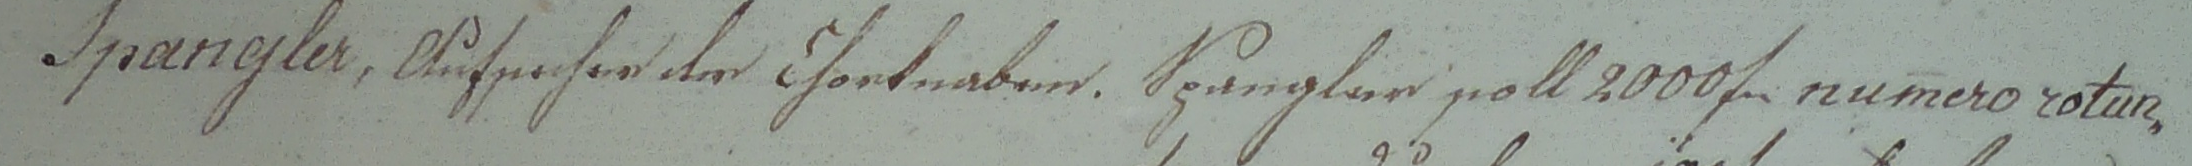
Spangler, Aufseher der Chorknaben. Spangler soll 2000fn numero rotun¬
